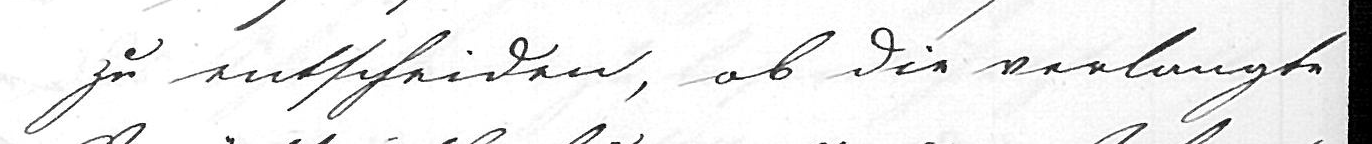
zu entscheiden, ob die verlangte
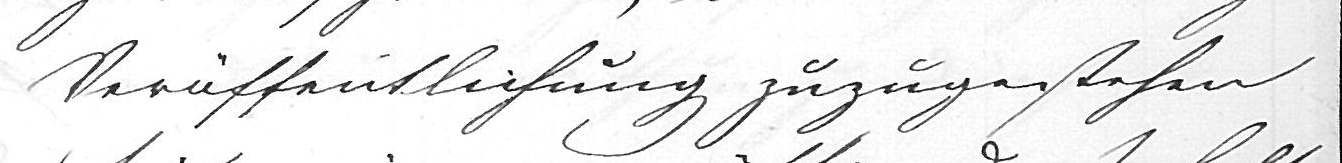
Veröffentlichung zuzugestehen
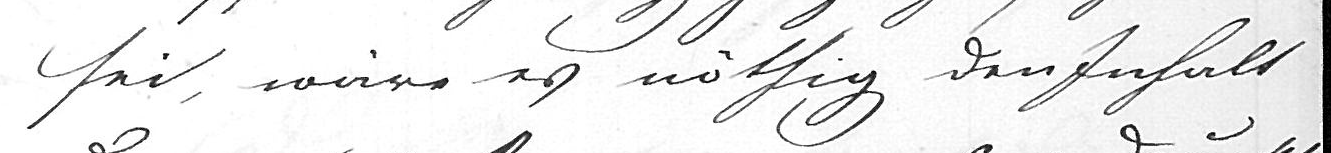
sei, wäre es nöthig den Inhalt
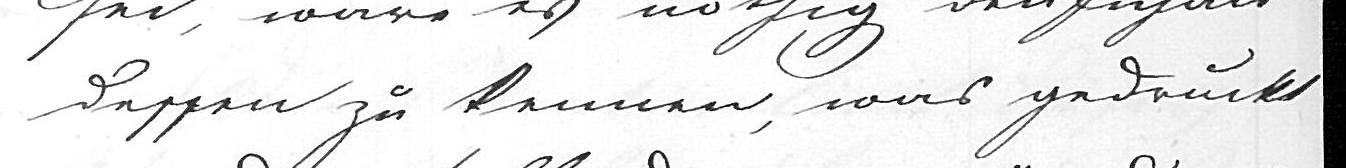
dessen zu kennen, was gedruckt
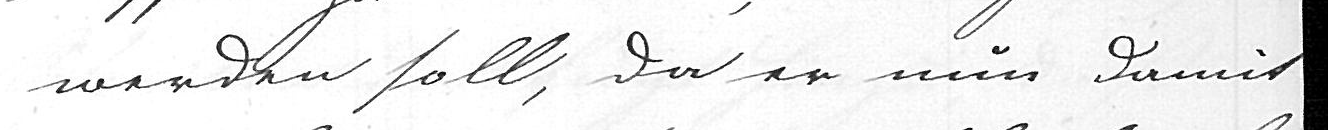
werden soll, da er nun damit
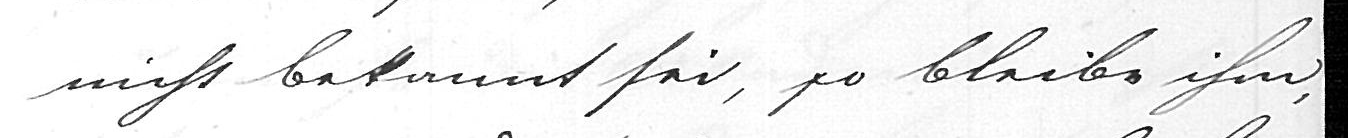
nicht bekannt sei, so bleibe ihm,
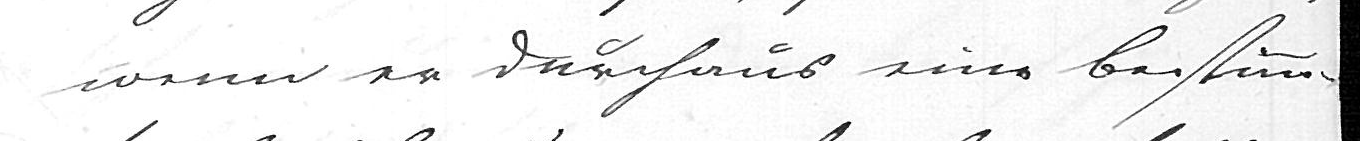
wenn er durchaus eine bestimm-
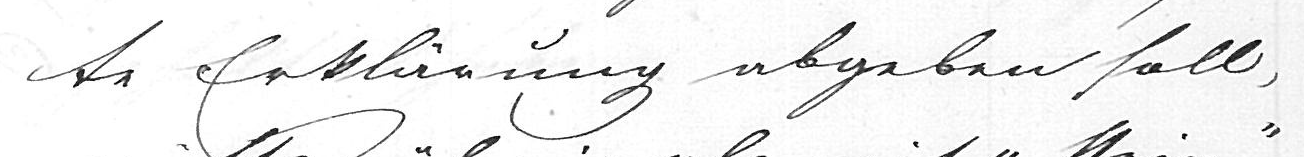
te Erklärung abgeben soll,
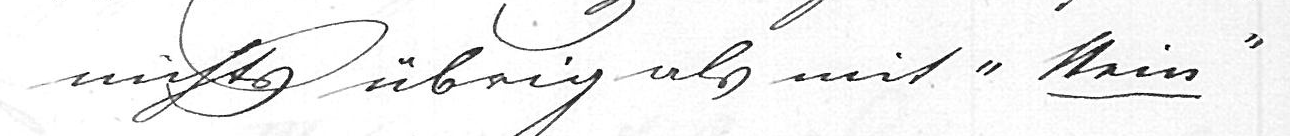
nichts übrig als mit "Nein"
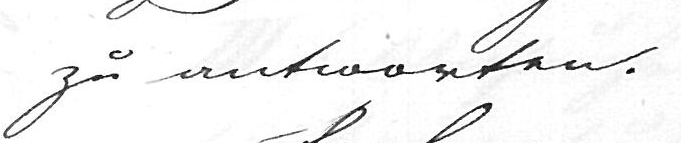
zu antworten.
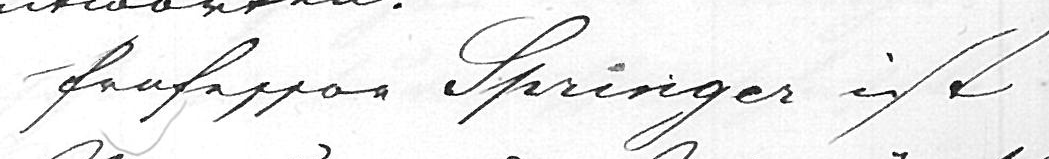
Professor Springer ist
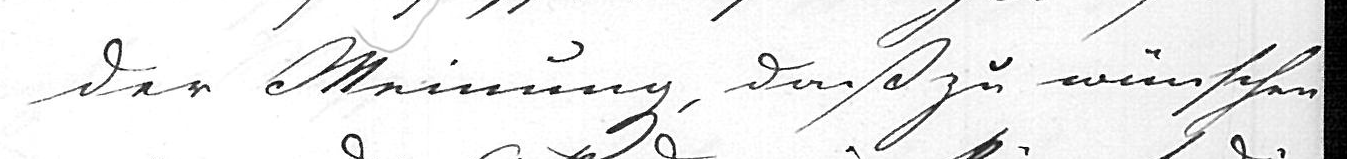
der Meinung, daß zu wünschen
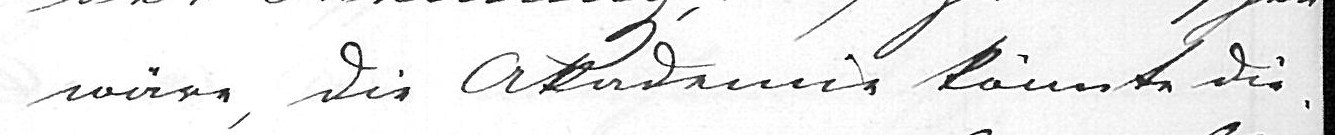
wäre, die Akademie könnte die-
